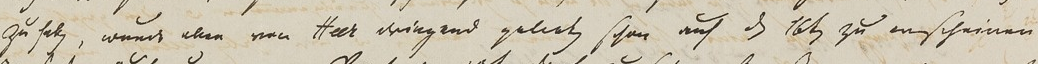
zu haben, wurde aber von Heer dringend gebeten schon auf den 16ten zu erscheinen.
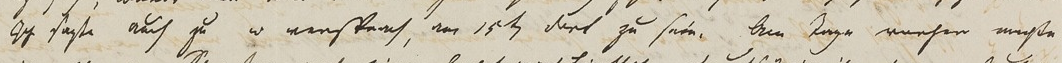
Ich sagte auch zu u versprach, am 15ten dort zu sein. Am Tage vorher machte
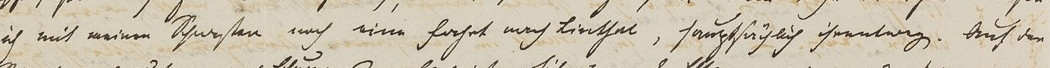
ich mit meiner Schwester noch eine Fahrt nach Linthal, hauptsächlich ihrentwegen. Auf der
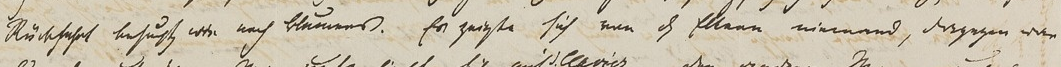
Rückfahrt besuchten wir noch Blumers. Es zeigte sich von den Eltern niemand, dagegen war
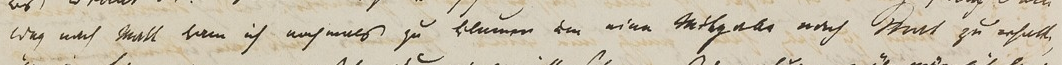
Weg nach Matt kam ich nochmals zu Blumer um eine Mitgabe nach Matt zu erhalten,
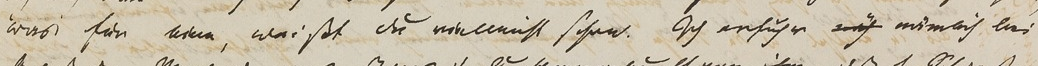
was für eine, weißt du vielleicht schon. Ich erfuhr auch nämlich bei
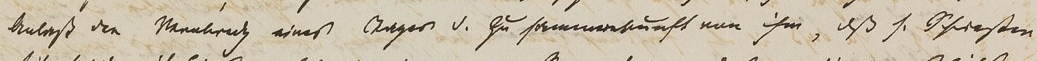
Anlaß der Verabredg eines Tages d. Zusammenkunft von ihm, dß s. Schwester
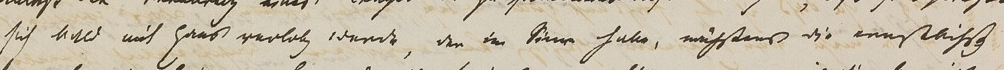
sich bald mit Hans verloben werde, der im Sinne habe, nächstens die ernstlichsten
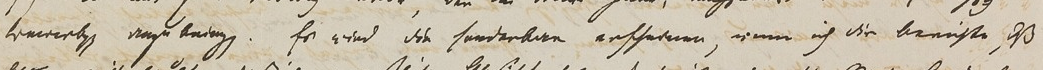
Bewerbgen anzubringen. Es wird dir sonderbar erscheinen, wenn ich dir berichte, dß
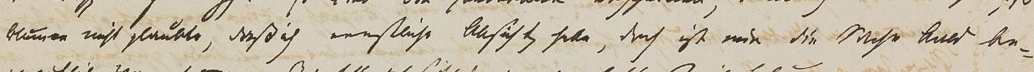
Blumer nicht glaubte, daß ich ernstliche Absichten hatte, doch ist mir die Sache bald be-
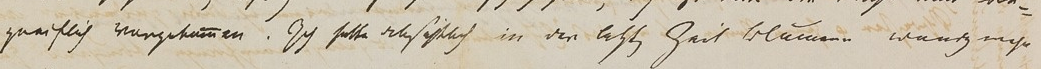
greiflich vorgekommen. Ich hatte absichtlich in der letzten Zeit Blumern wenig mehr
